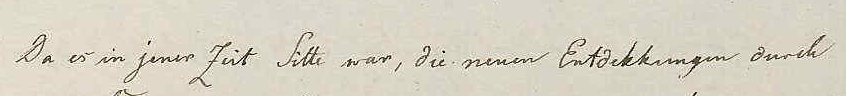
Da es in jener Zeit Sitte war, die neuen Entdekkungen durch
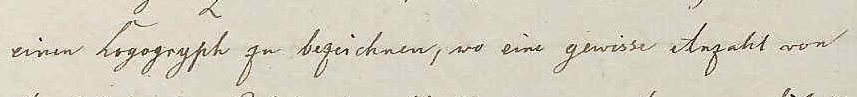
einen Logogryph zu bezeichnen, wo eine gewisse Anzahl von
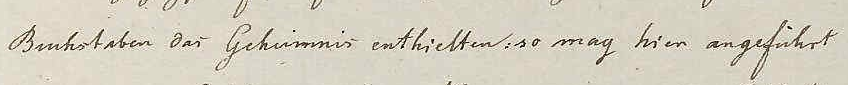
Buchstaben das Geheimnis enthielten: so mag hier angeführt
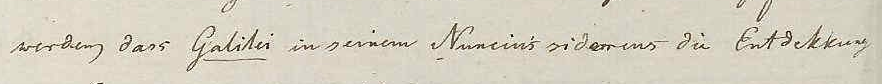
werden, dass Galilei in seinem Nuncius sidereus die Entdekkung
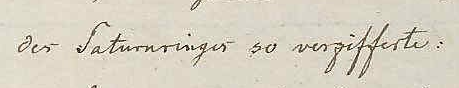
des Saturnringes so verzifferte:
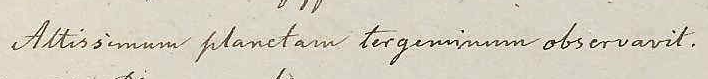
Altissimum planetam tergeminum observavit.
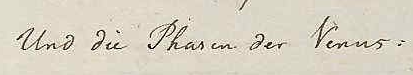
Und die Phasen der Venus:
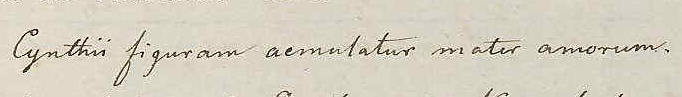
Cynthii figuram aemulatur mater amorum.
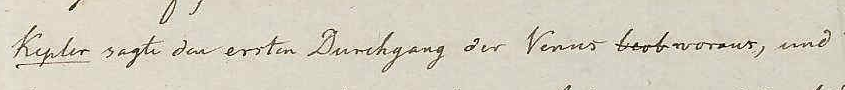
Kepler sagte den ersten Durchgang des Venus beob voraus, und
